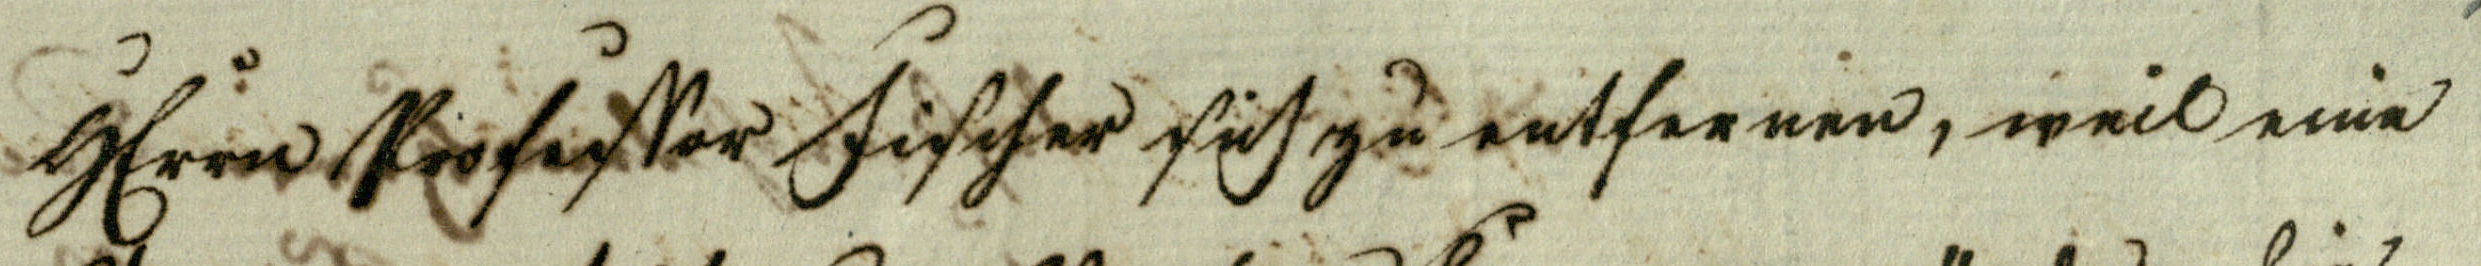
Herrn Professor Fischer sich zu entfernen, weil eine
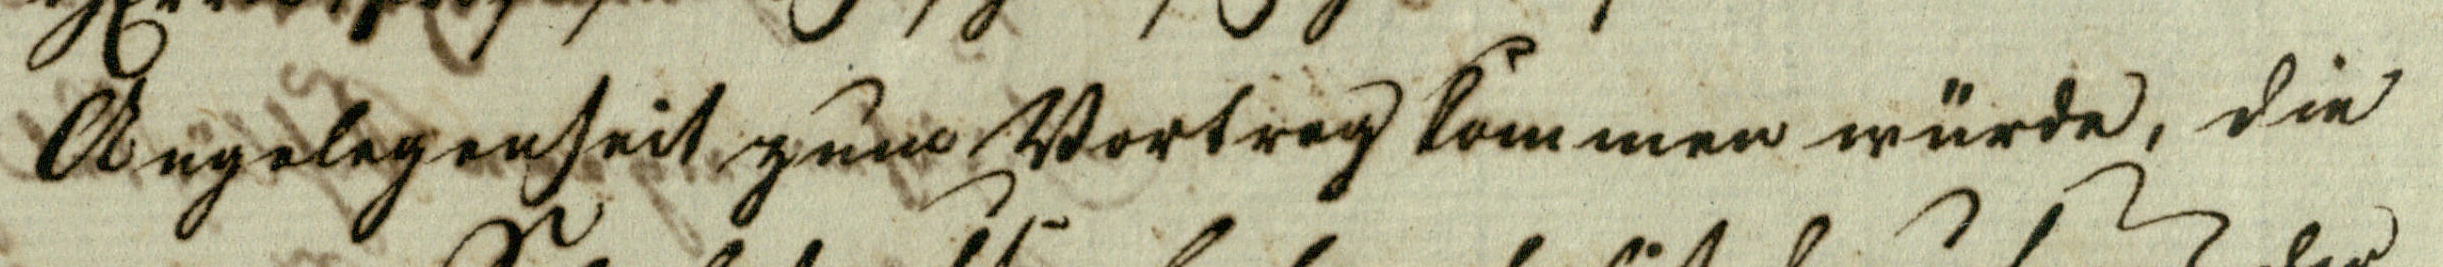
Angelegenheit zum Vortrag kommen würde, die
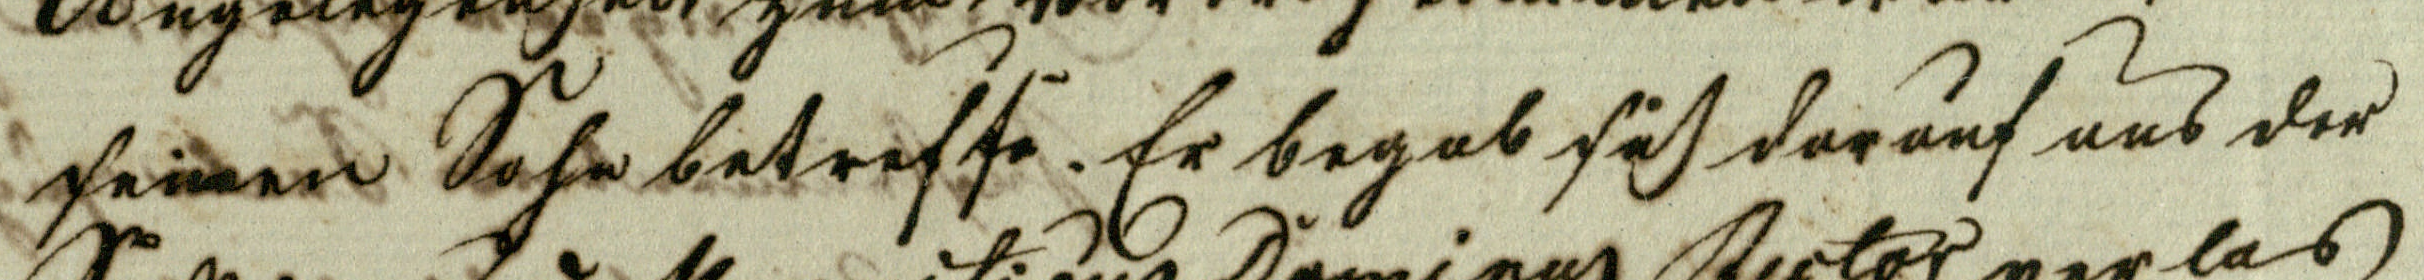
seinen Sohn betreffe. Er begab sich darauf aus der
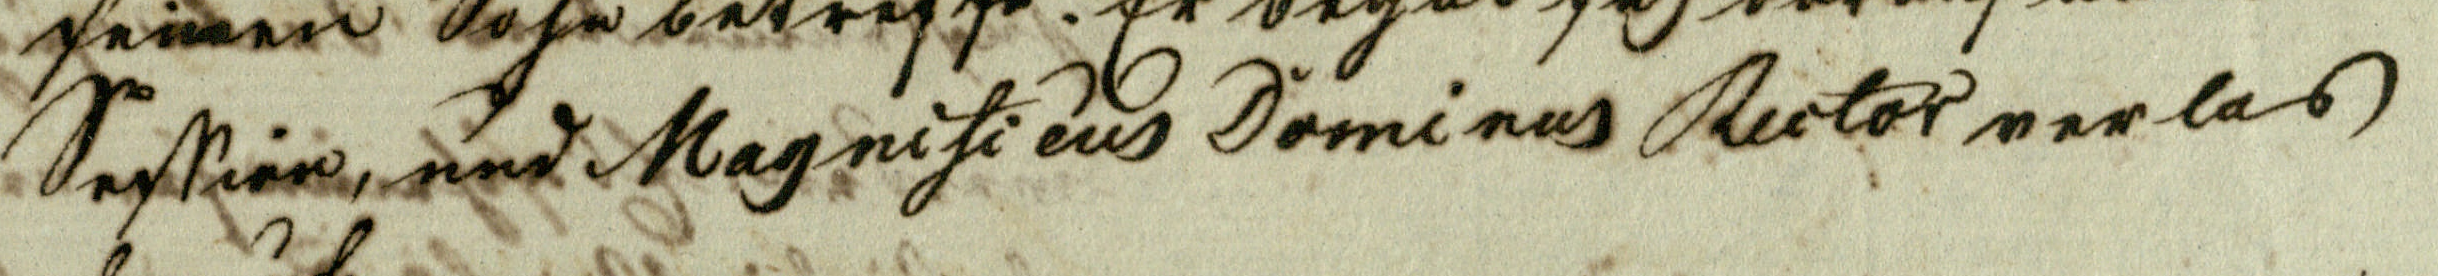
Session, und Magnificus Dominus Rector verlas
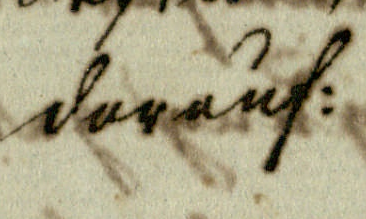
darauf:
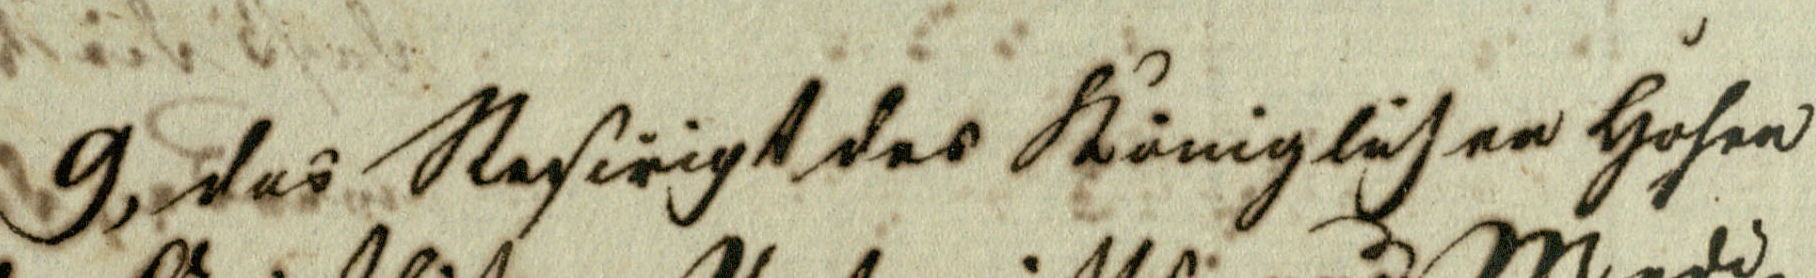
9, das Rescript des Königlichen Hohen
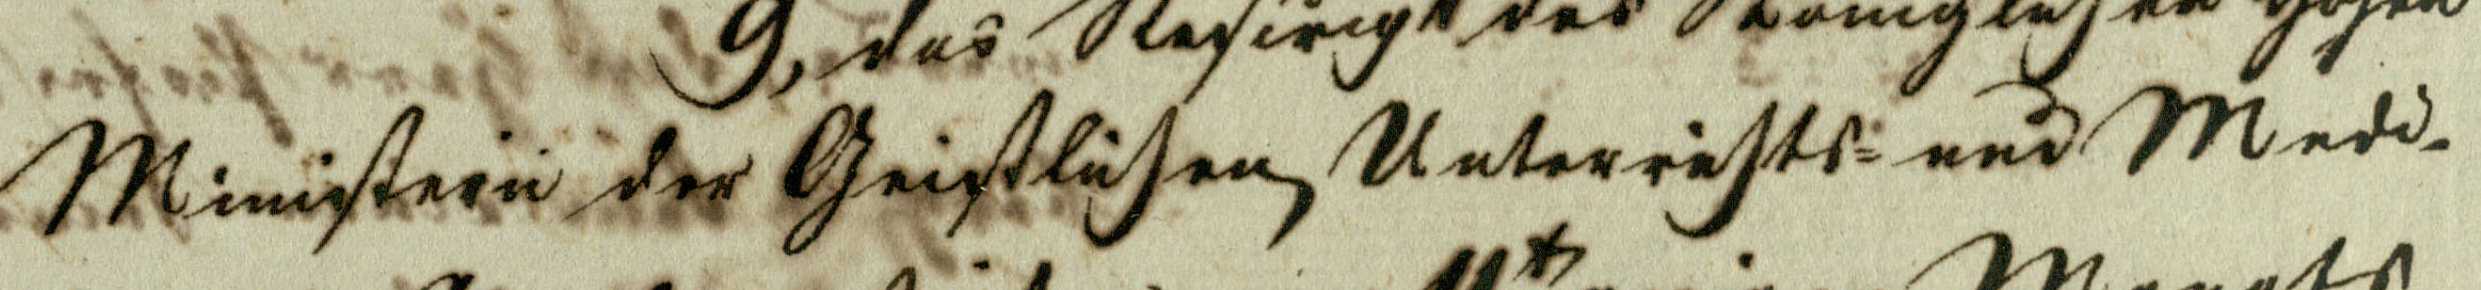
Ministerii der Geistlichen, Unterrichts und Medi¬
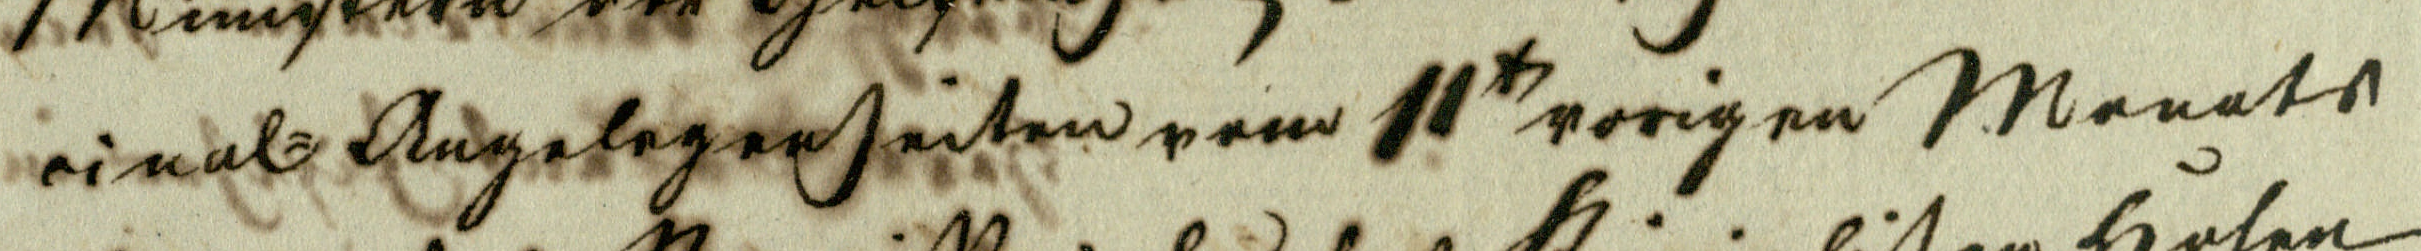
cinal Angelegenheiten vom 11 t vorigen Monats
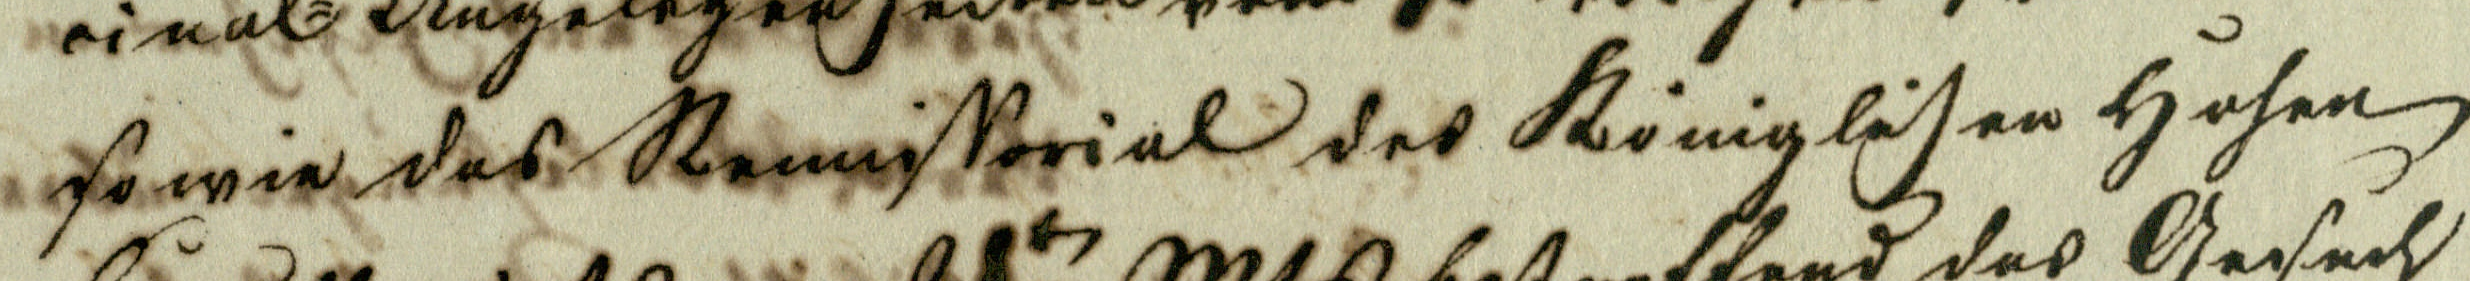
so wie das Remissorial des Königlichen Hohen
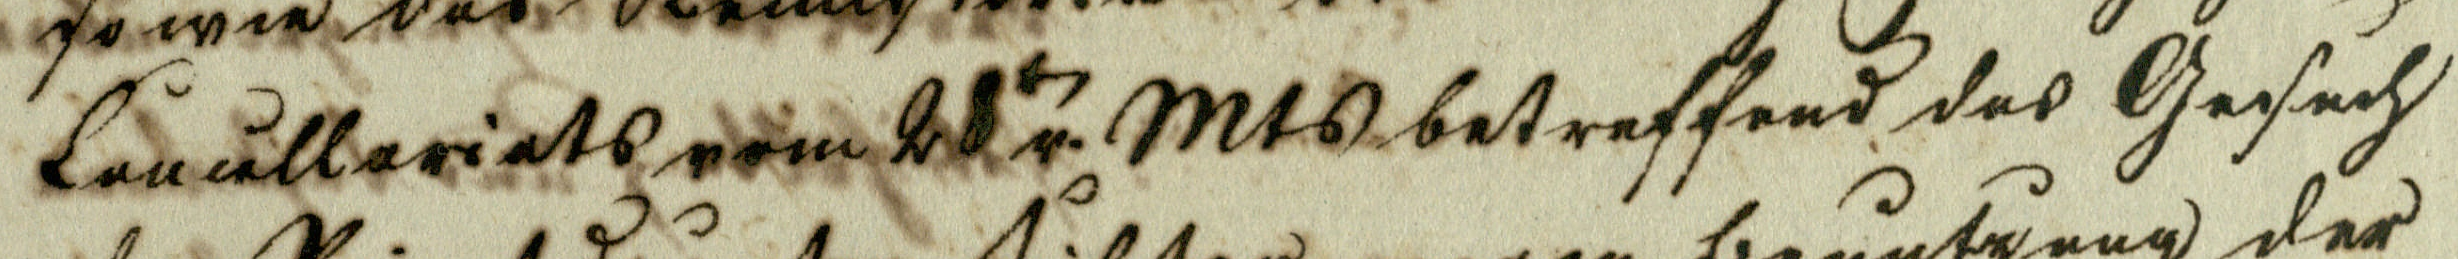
Cancellariats vom 28 t v. Mts betreffend das Gesuch
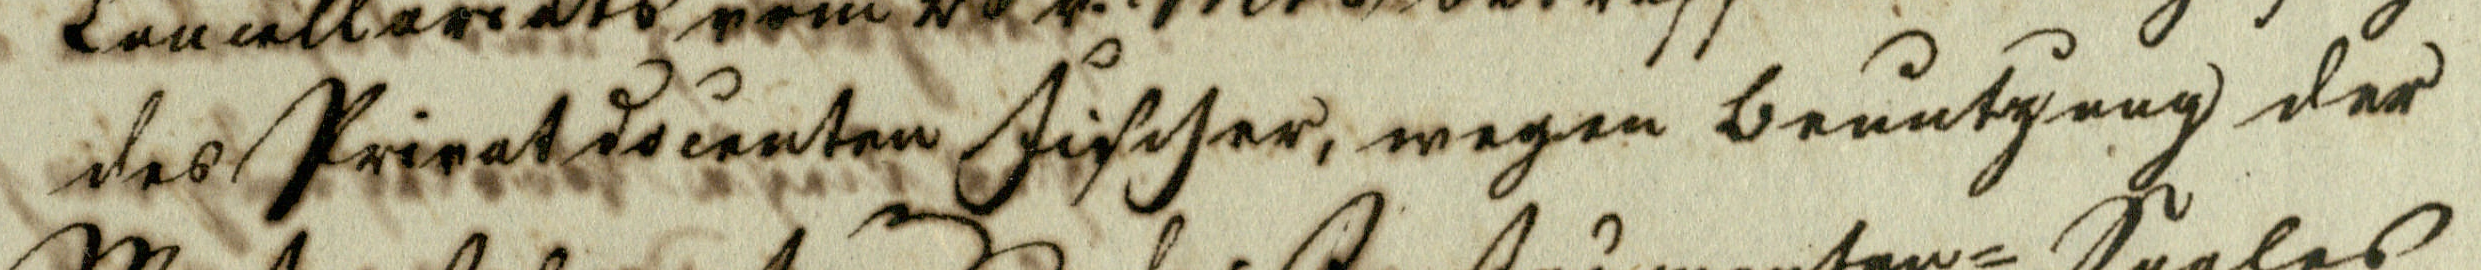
des Privatdocenten Fischer, wegen Benutzung der
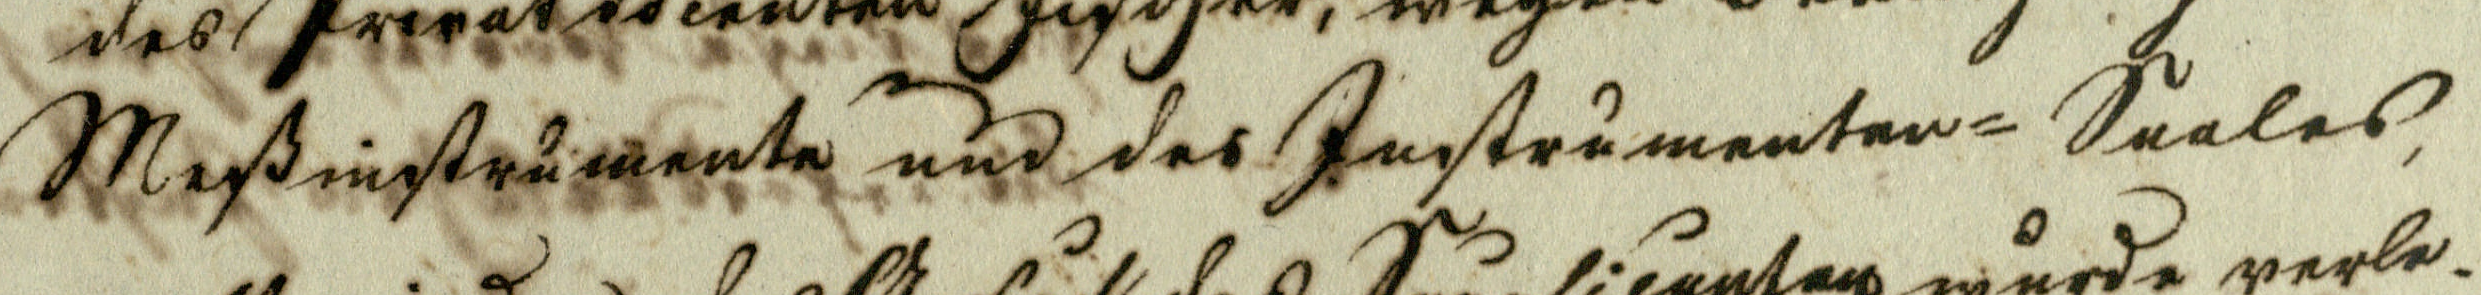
Meßinstrumente und des Instrumenten- Saales
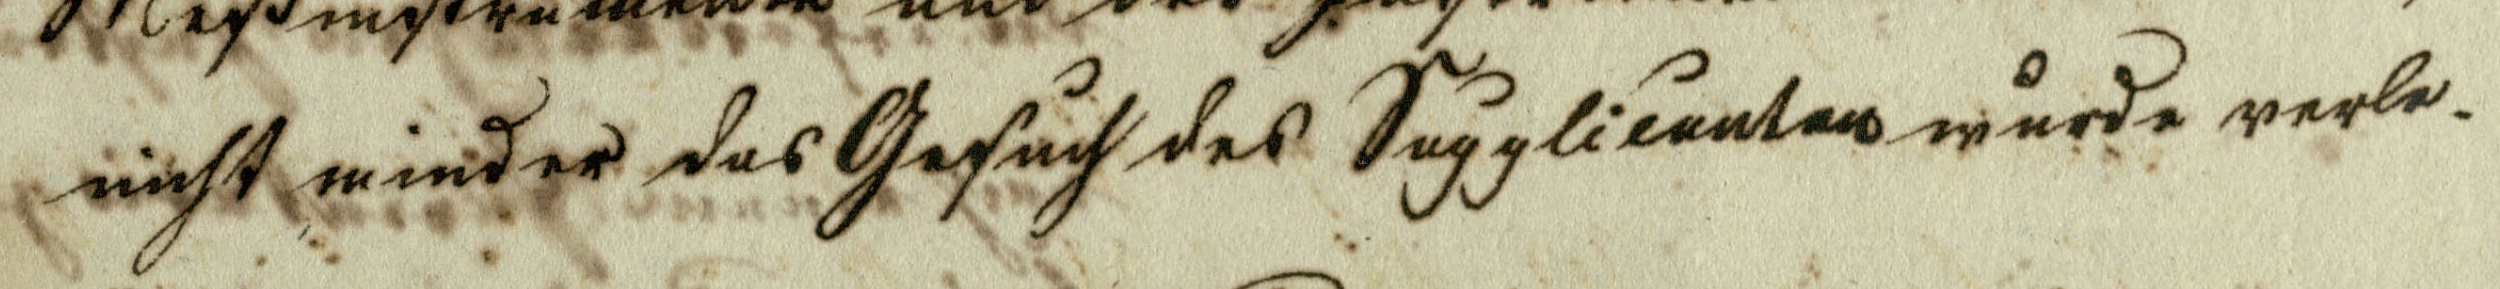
nicht minder das Gesuch des Supplicanten wurde verle¬
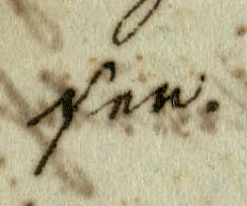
sen.
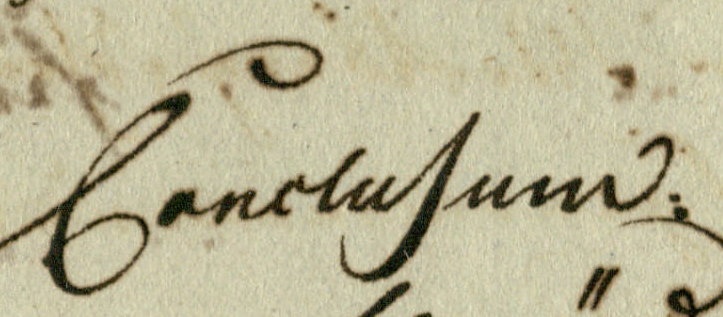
Conclusum:
